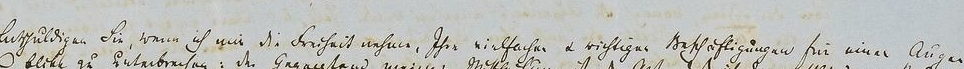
Entschuldigen Sie, wenn ich mir die Freiheit nehme, Ihre vielfachen & wichtigen Beschäftigungen für einen Augen-
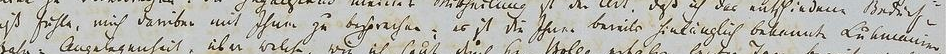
niß fühle, mich darüber mit Ihnen zu besprechen; es ist die Ihnen bereits hinlänglich bekannte Lukmanier-
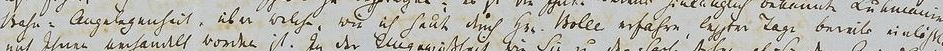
Bahn-Angelegenheit über welche, wie ich heute durch Hrn. Boller erfahre, letzter Tage bereits einläßlich
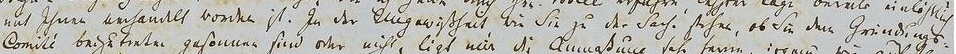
mit Ihnen verhandelt worden ist. In der Ungewißheit, wie Sie zu der Sache stehen, ob Sie dem Gründungs-
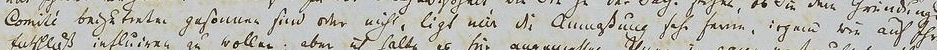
Comité beizutreten gesonnen sind oder nicht, ligt mir die Anmaßung sehr ferne, irgend wie auf Ihren
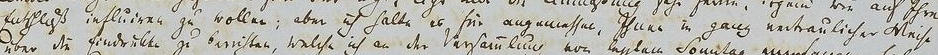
Entschluß influiren zu wollen; aber ich halte es für angemessen, Ihnen in ganz vertraulicher Weise
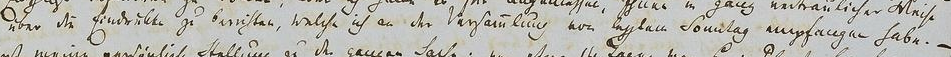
über die Eindrükke zu berichten, welche ich an der Versammlung von letztem Sonntag empfangen habe. –
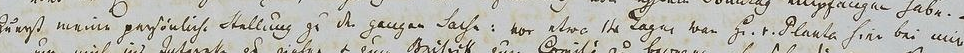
Zuerst meine persönliche Stellung zu der ganzen Sache: vor etwa 14 Tagen war Hr. v. Planta hier bei mir,
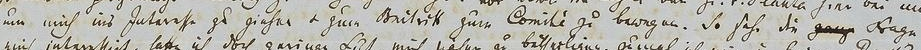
um mich ins Interesse zu ziehen & zum Beitritt zum Comité zu bewegen. So sehr die ganze Frage
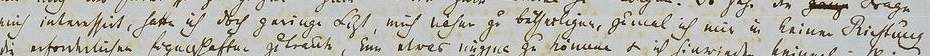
mich interessirt, hatte ich doch geringe Lust, mich näher zu betheiligen, zumal ich mir in keiner Richtung
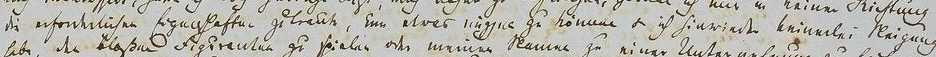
die erforderlichen Eigenschaften zutraute, um etwas nüzzen zu können & ich hinwieder keinerlei Neigung
